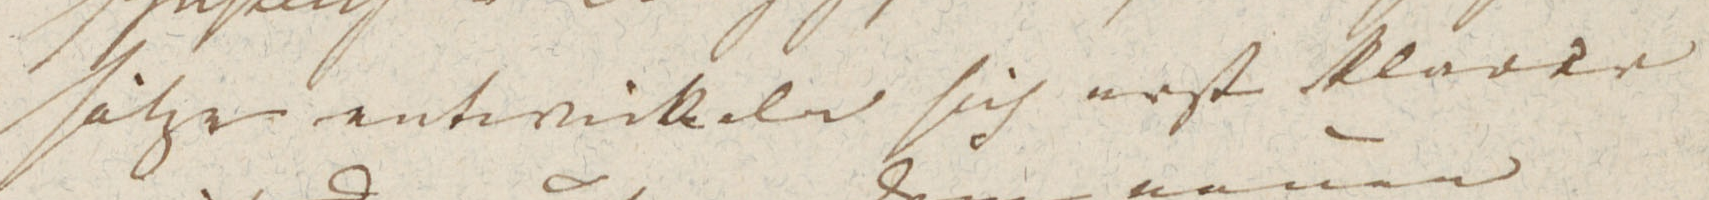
sätze entwickeln sich erst klarer
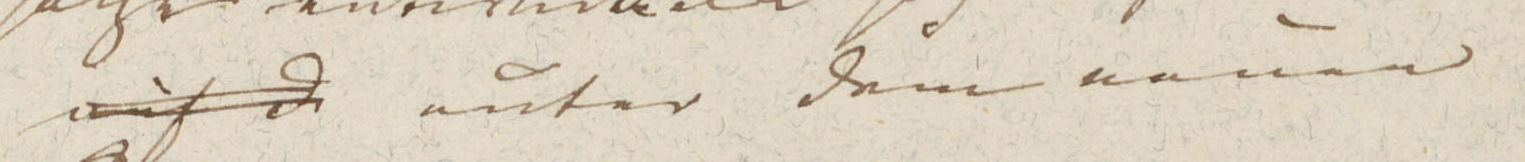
auf d unter dem neuen
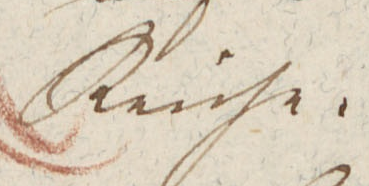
Reiche.
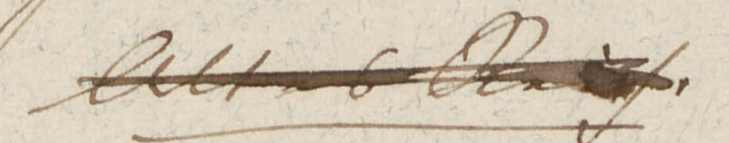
Altes Reich. Pyramiden
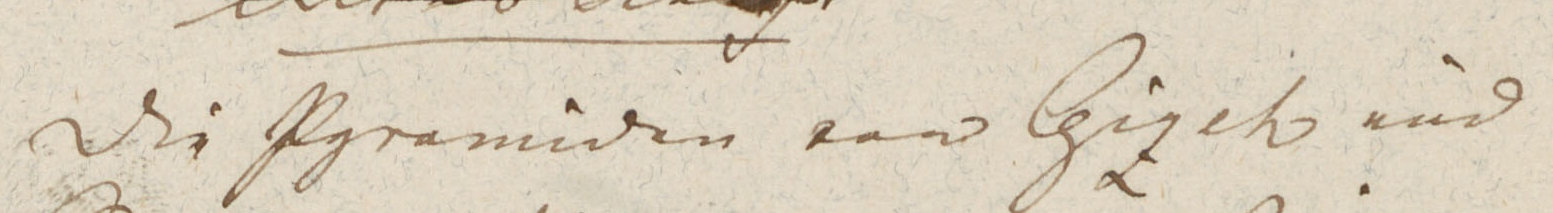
Die Pyramiden von Gizeh und
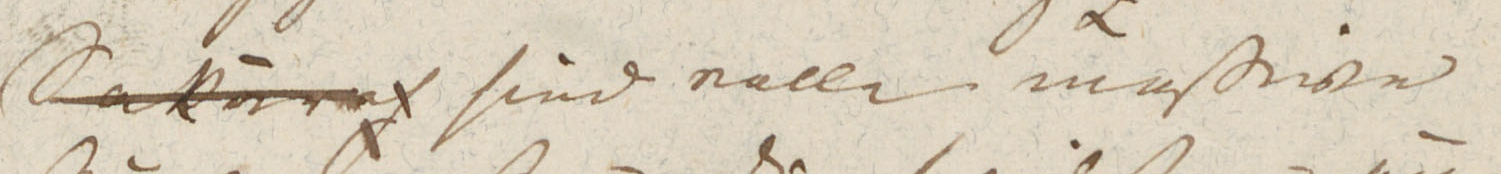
Dakarah sind volle massive
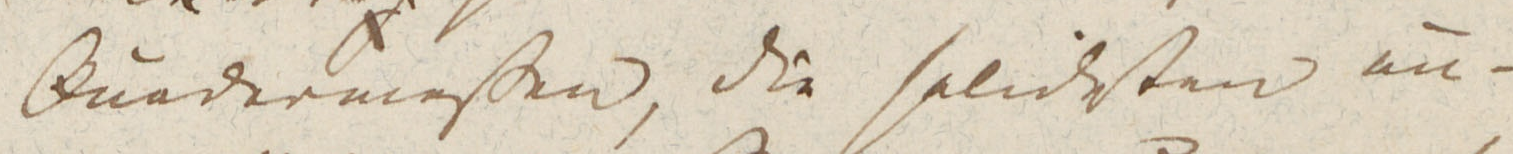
Quadermassen, die solidesten un-
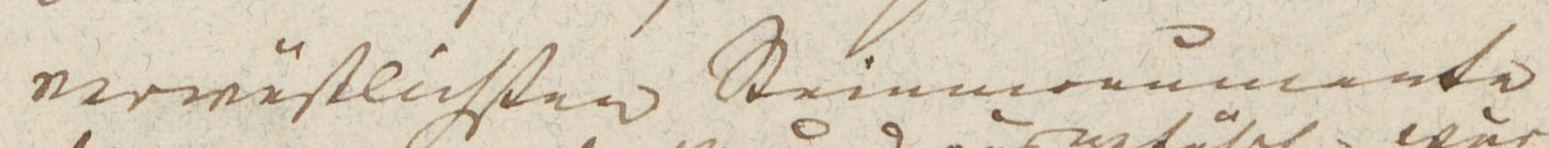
verwüstlichsten Steinmonumente
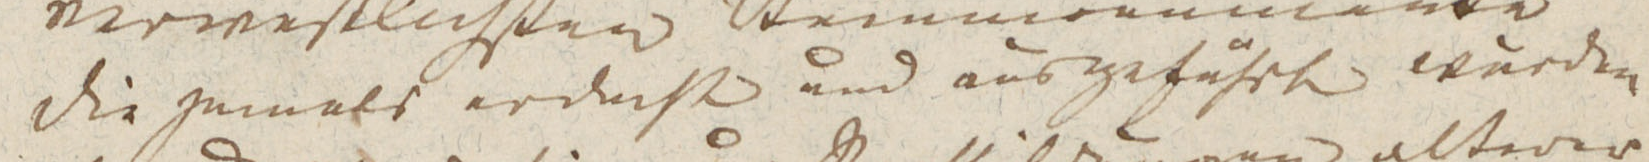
die jemals erdacht und ausgeführt wurden
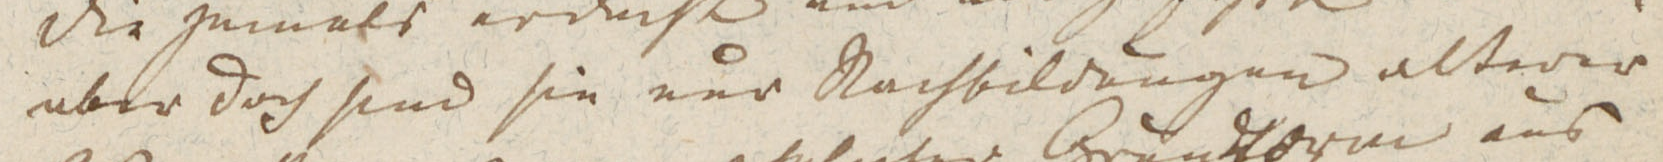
aber doch sind sie nur Nachbildungen alterer
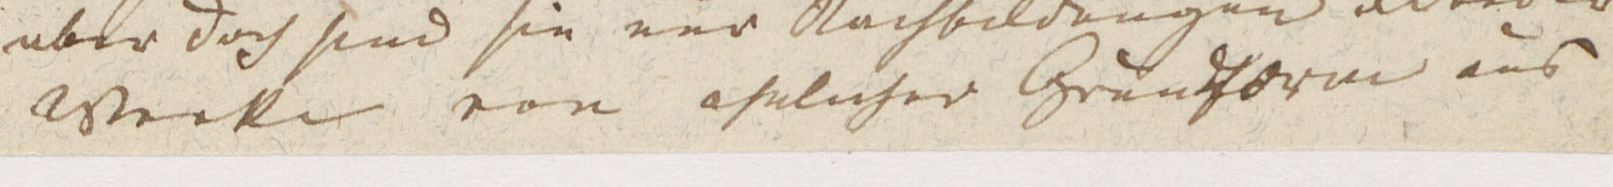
Werke von ahnlicher Grundform aus
